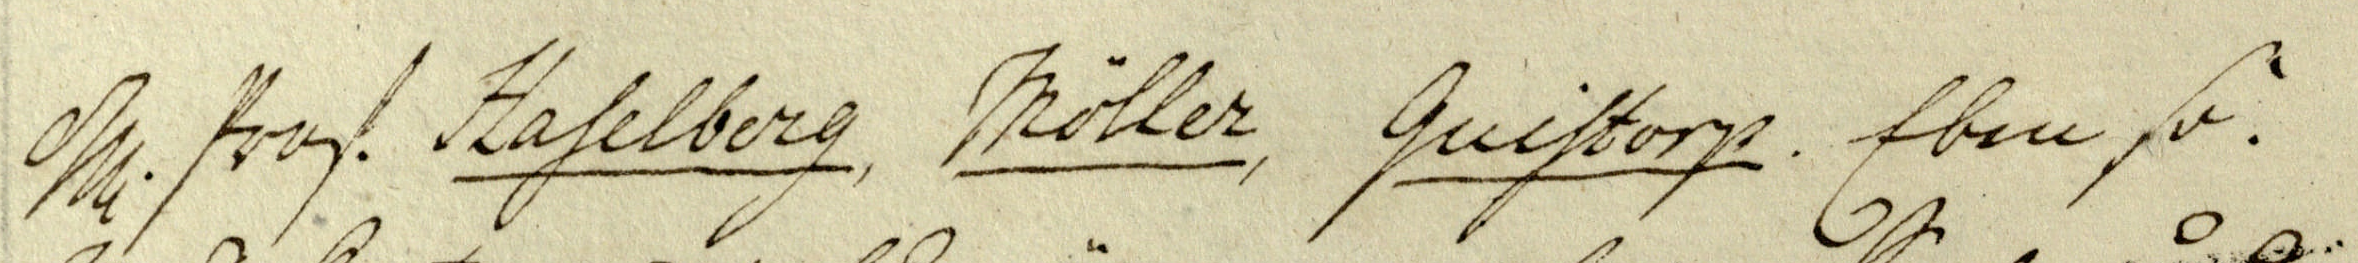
dh. Prof. Haselberg, Möller, Quistorp. Eben so.
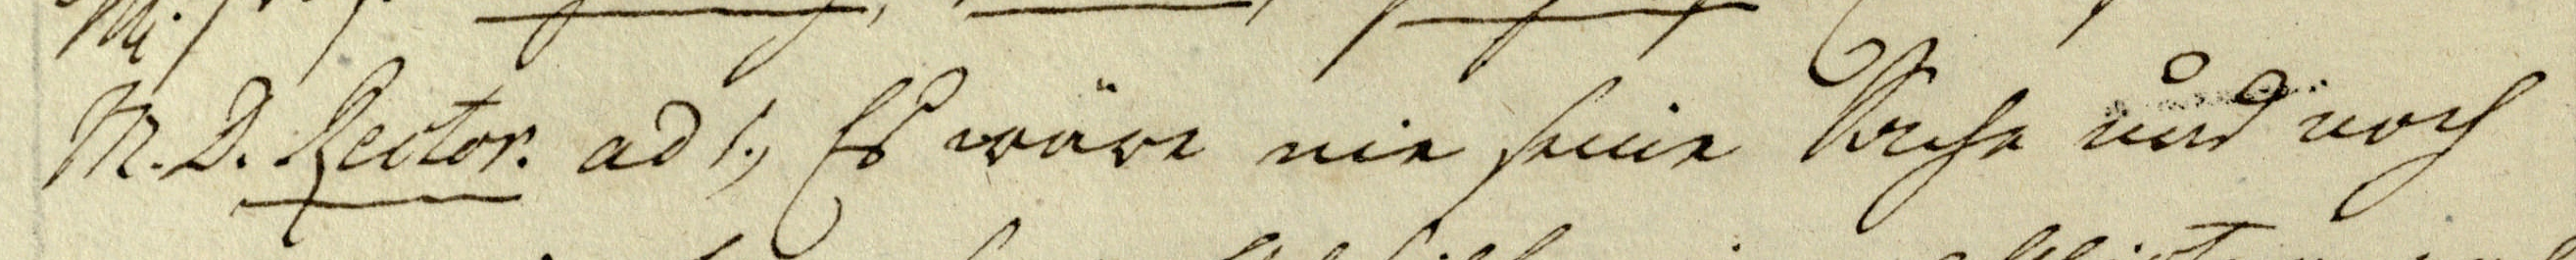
M. D. Rector. ad 1. Es wäre nie seine Sache und noch
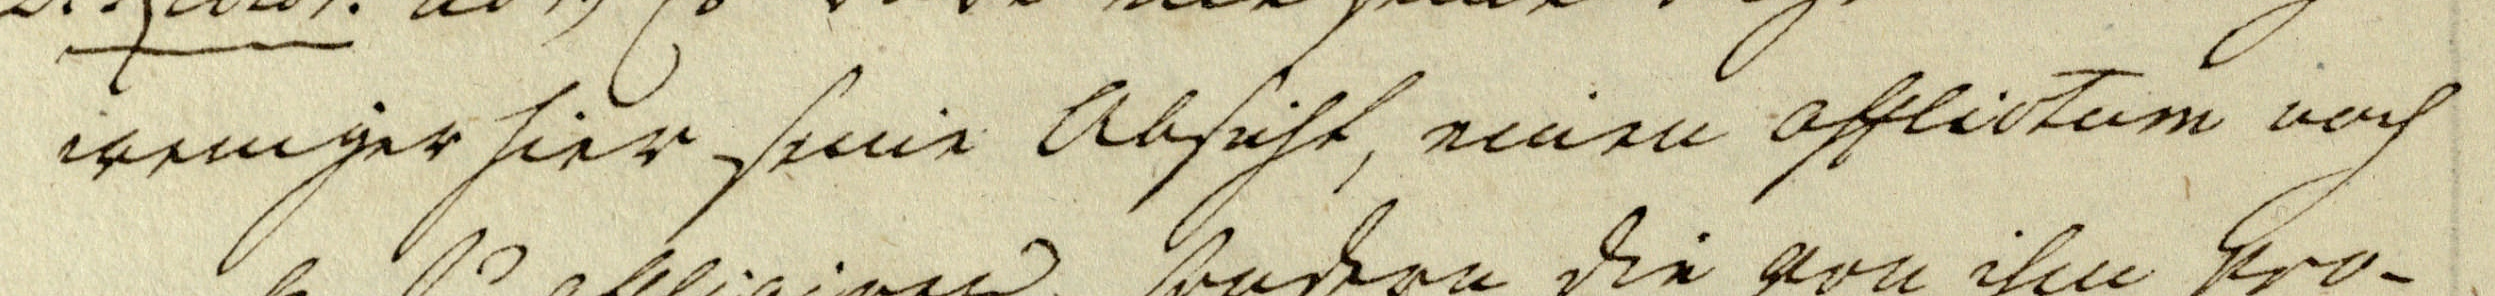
weniger hier seine Absicht, einen offlictum noch
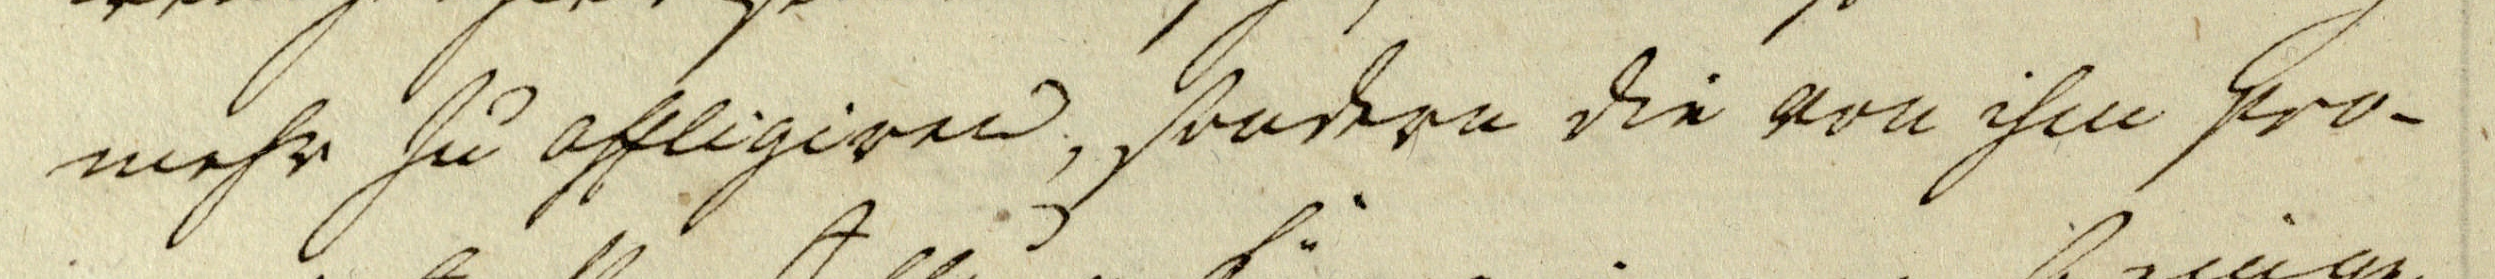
mehr zu offligiren, sondern die von ihm pro¬
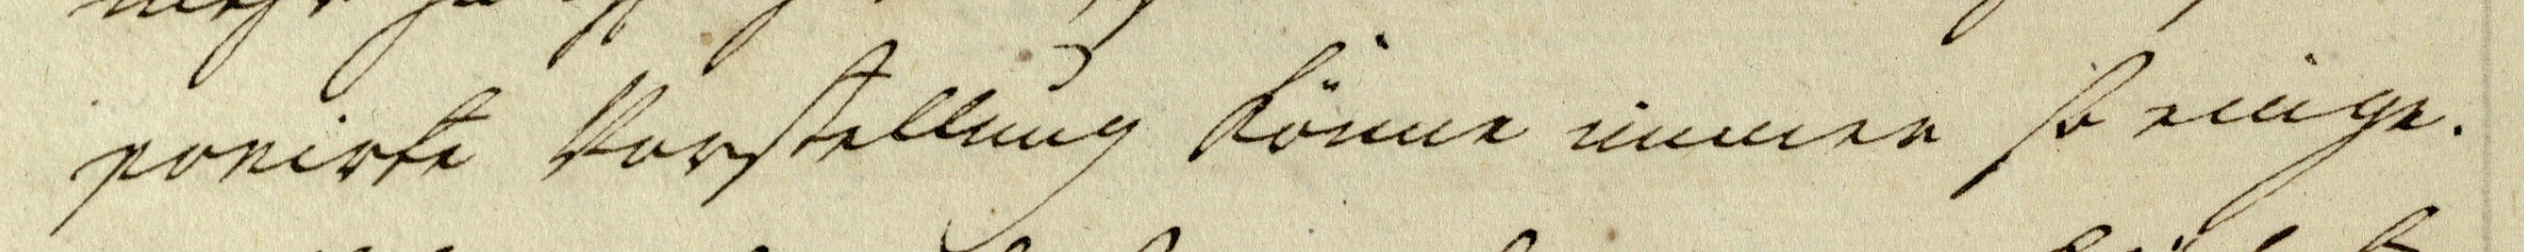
ponirte Vorstellung könne immer so einge¬
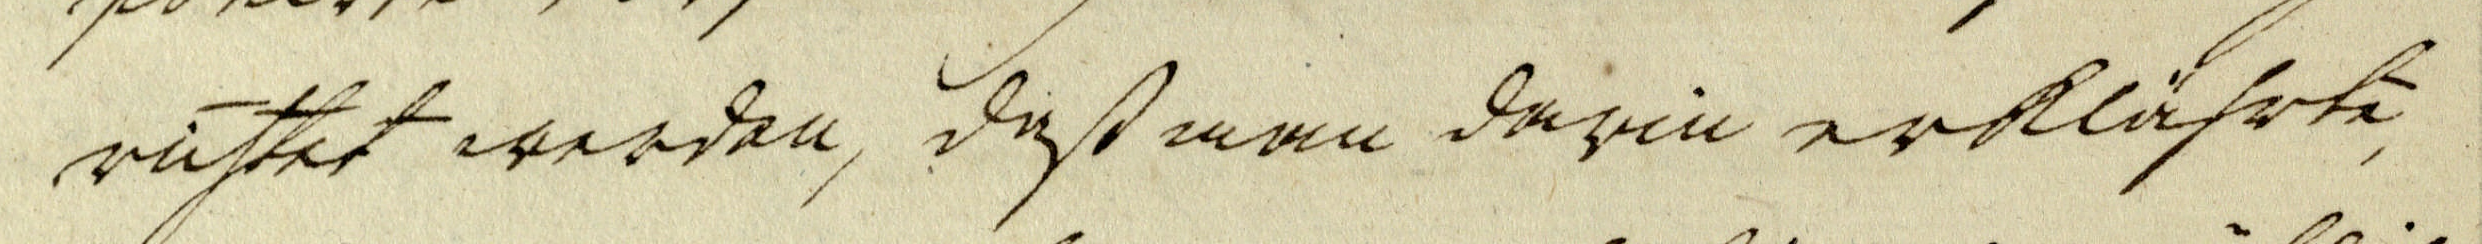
richtet, werden, daß man darin erklährte,
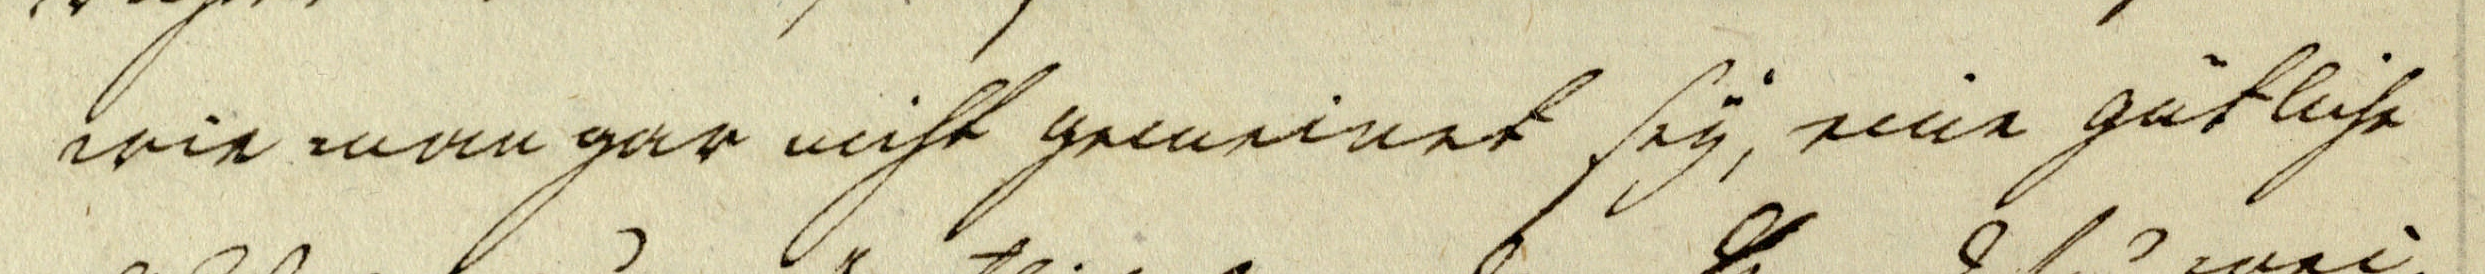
wie man gar nicht gemeinet seÿ, eine gütliche
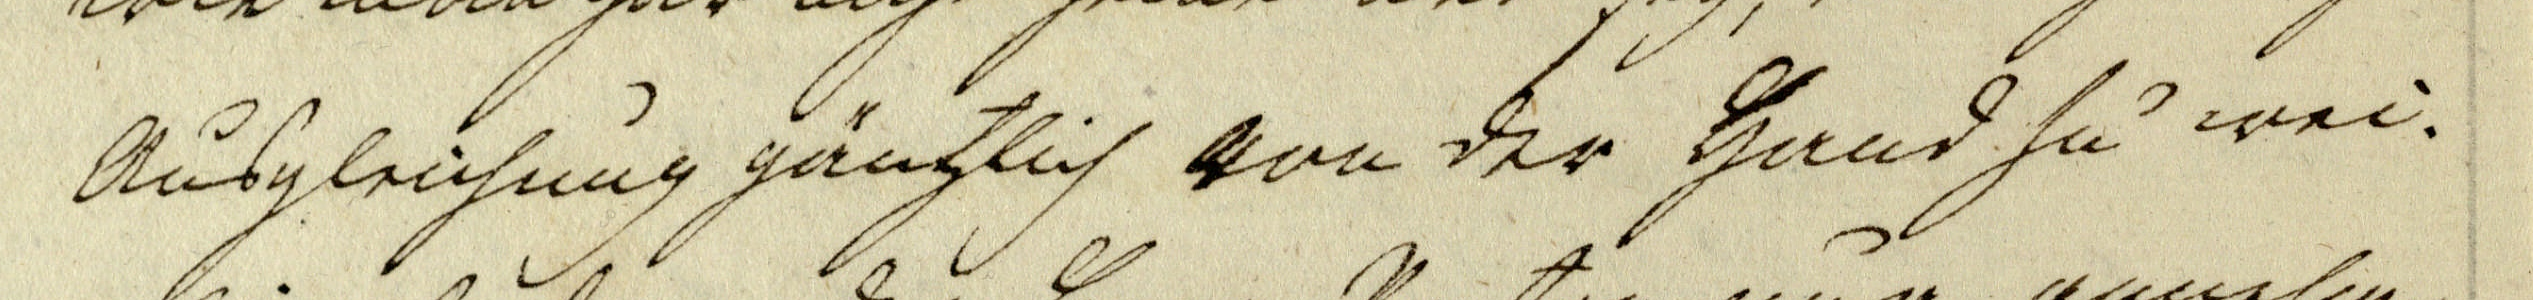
Ausgleichung gäntzlich von der Hand zu wei¬
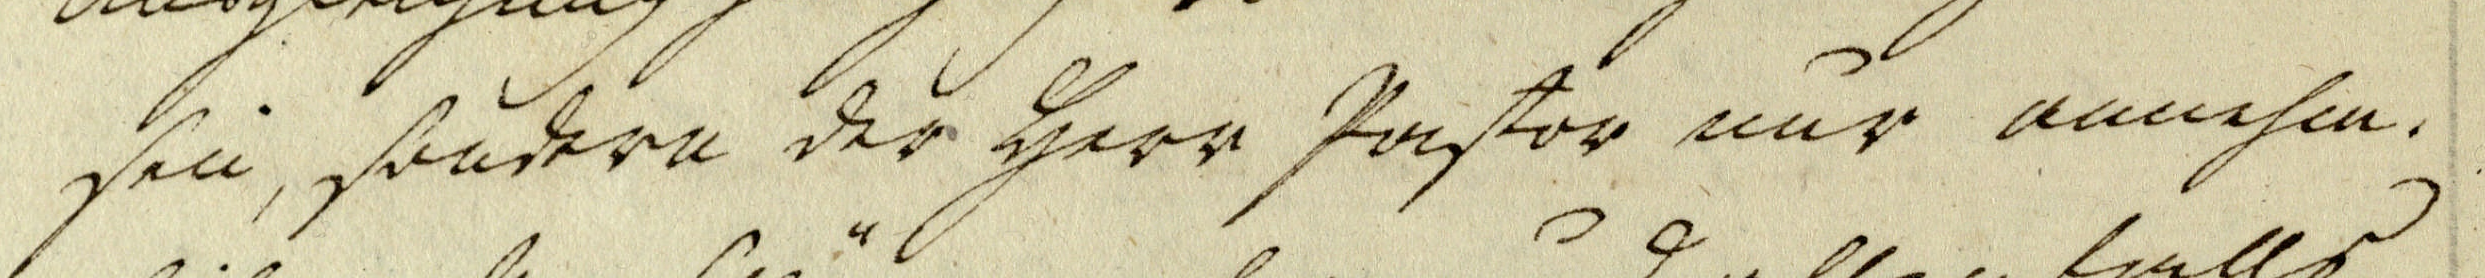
sen, sondern der Herr Pastor nur annehm¬
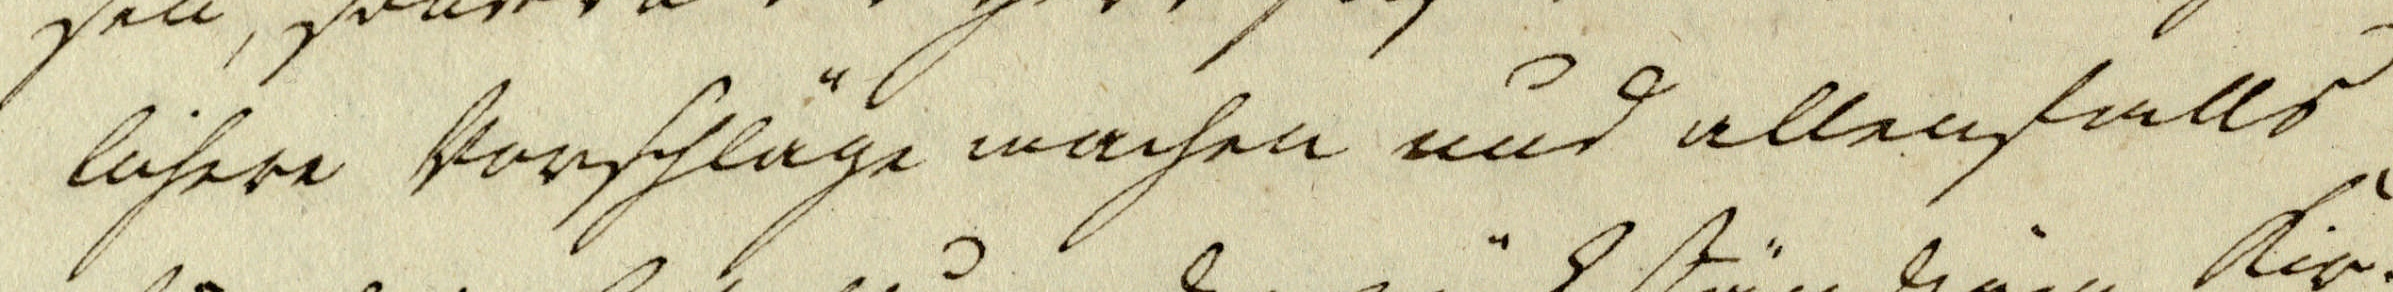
lichere Vorschläge machen und allenfalls
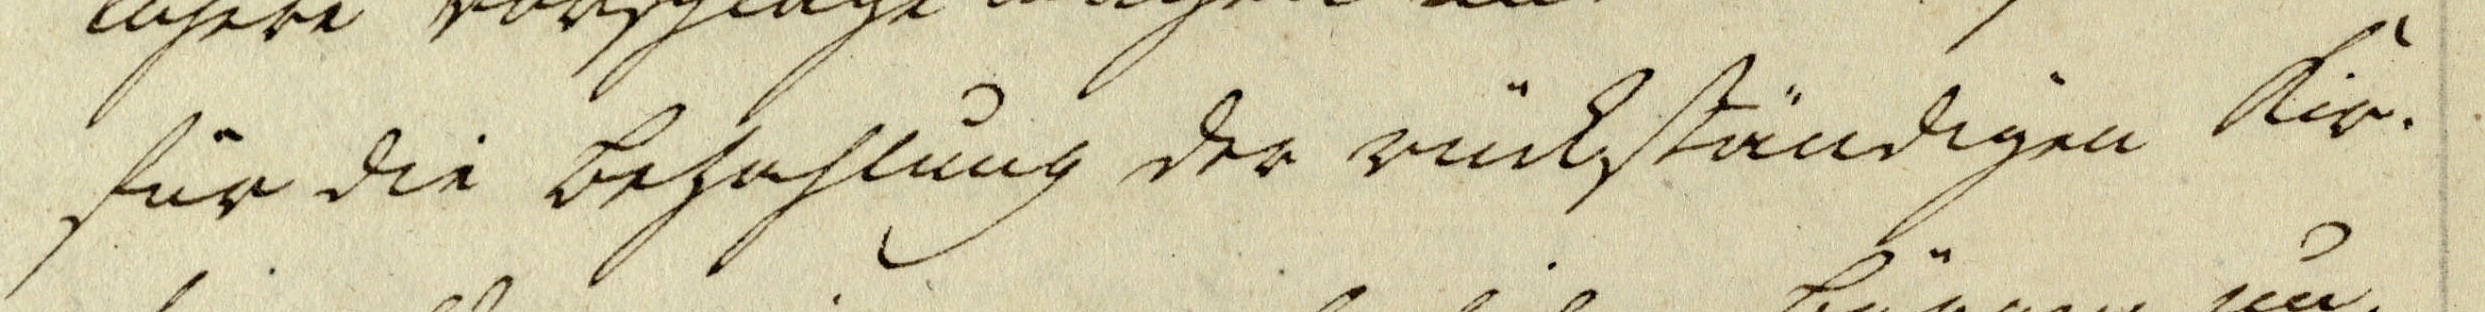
für die Bezahlung der rückständigen Kir¬
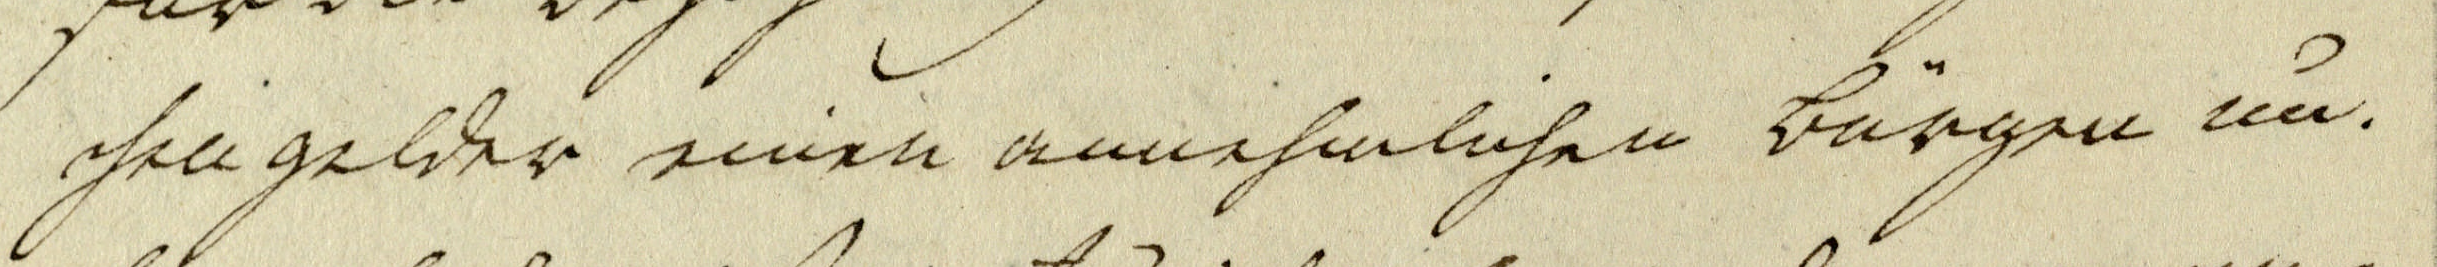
chengelder einen annehmlichen Bürgen un¬
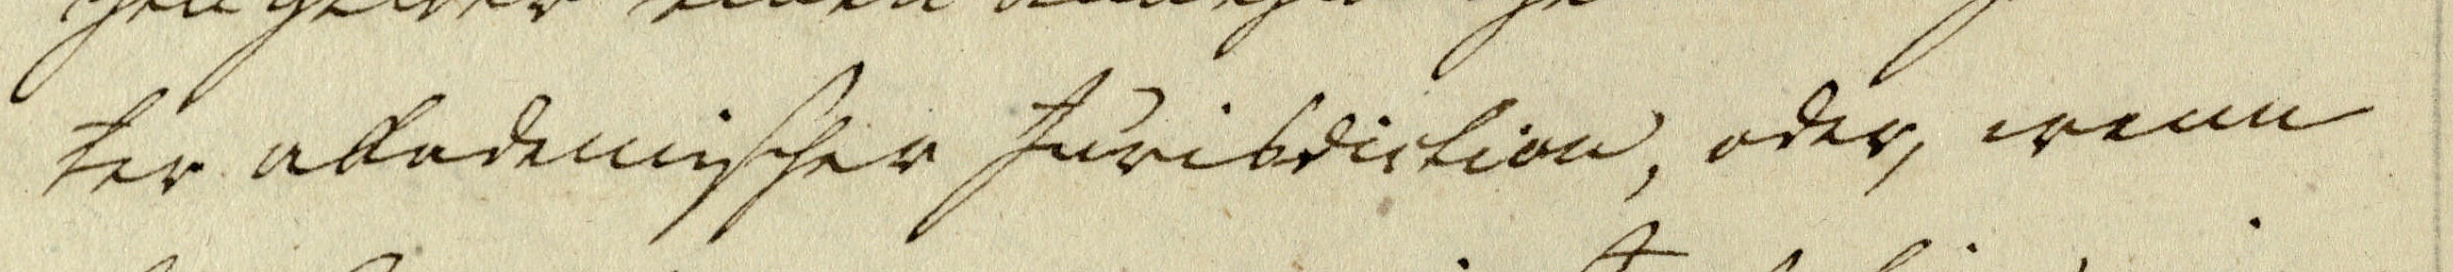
ter akademischer Jurisdiction, oder, wenn
